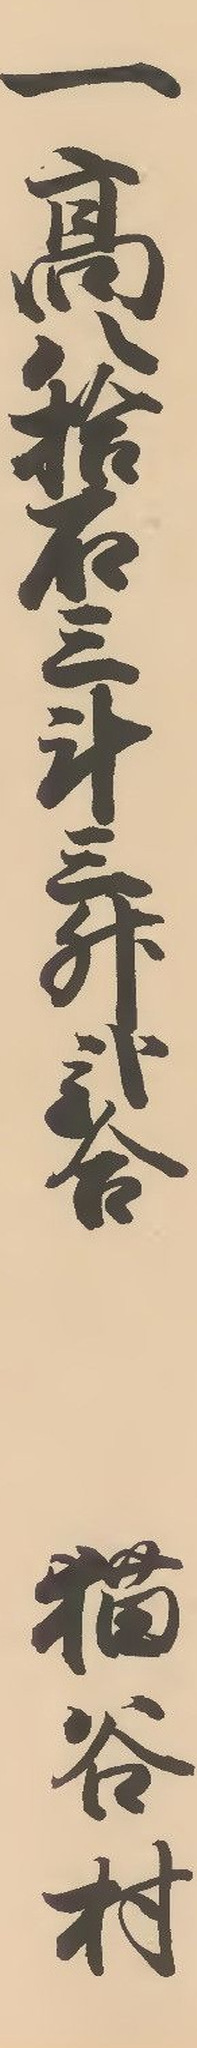一髙八拾石三斗三升弐合猫谷村
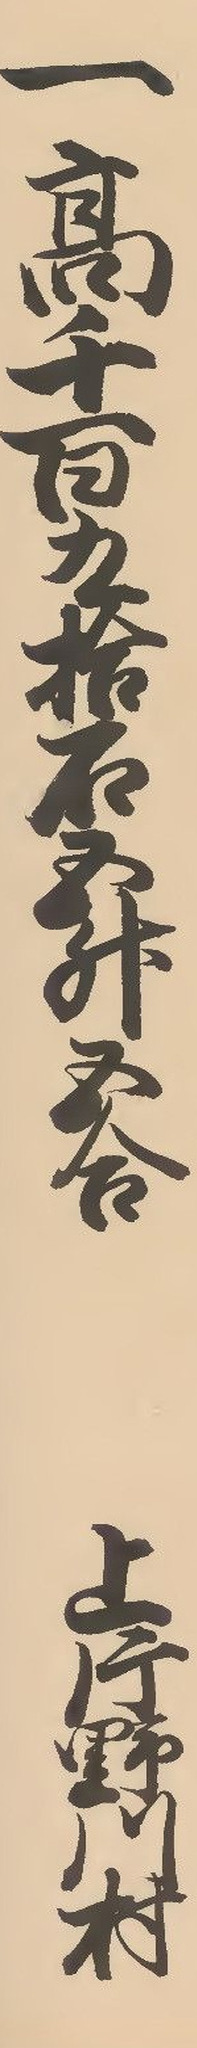一髙千百九拾石五升五合上片野川村
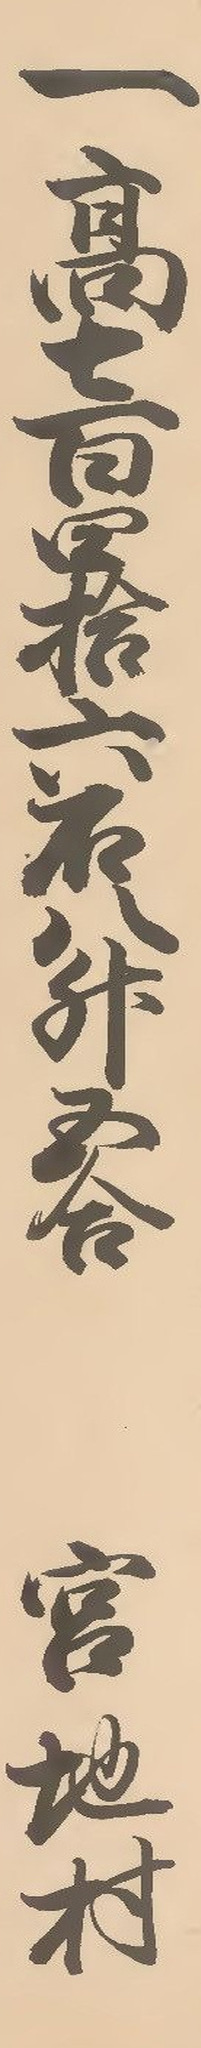一髙七百四拾六石八升五合宮地村
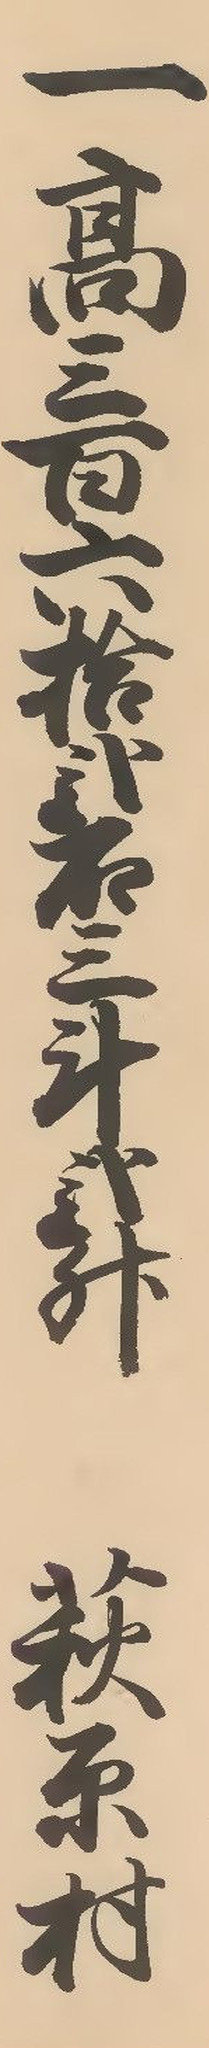一髙三百六拾弐石三斗弐升萩原村
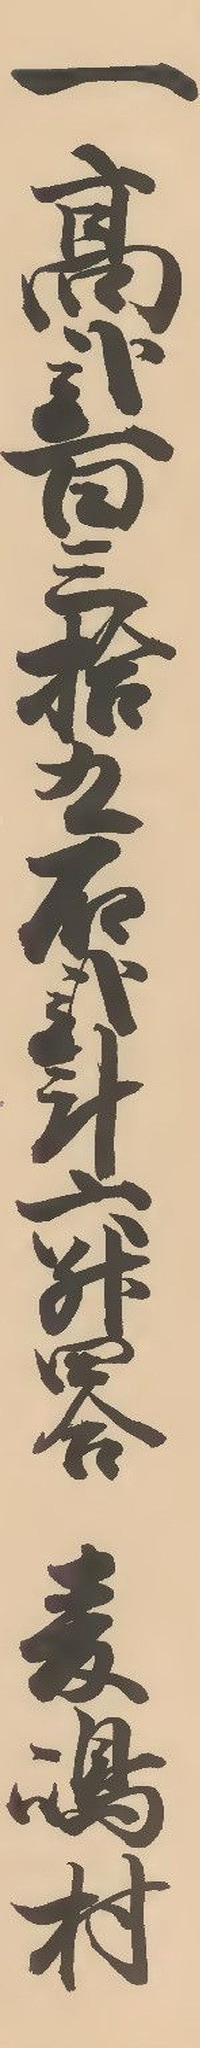一髙弐百三拾九石弐斗六升四合麦嶋村
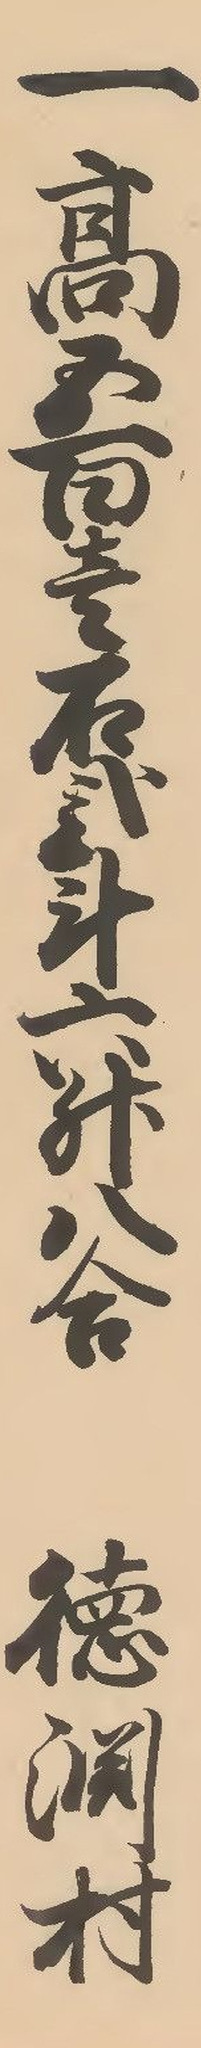一髙五百壱石弐斗六升八合徳淵村

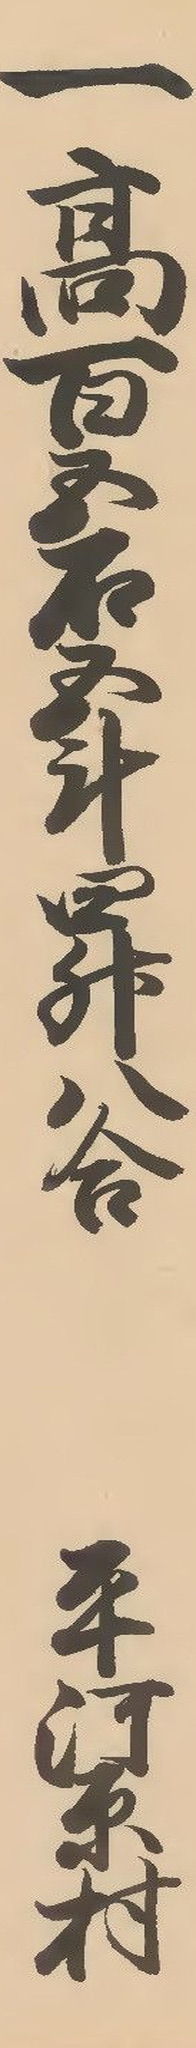一髙百五石五斗四升八合平河原村
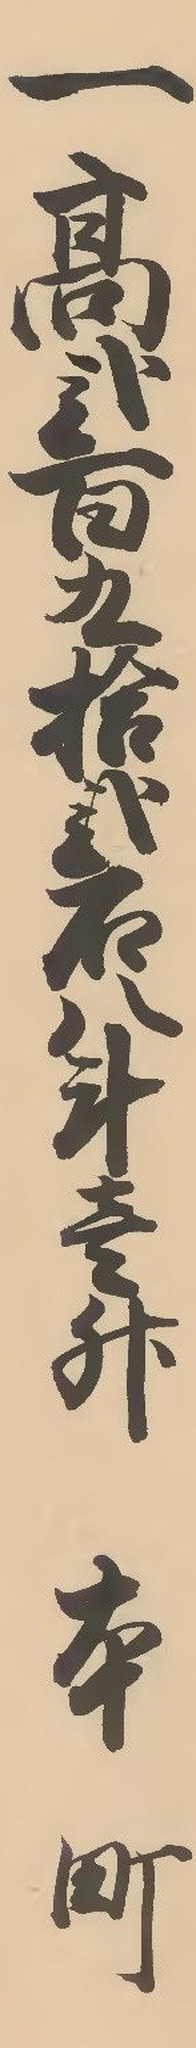一髙弐百九拾弐石八斗壱升本町
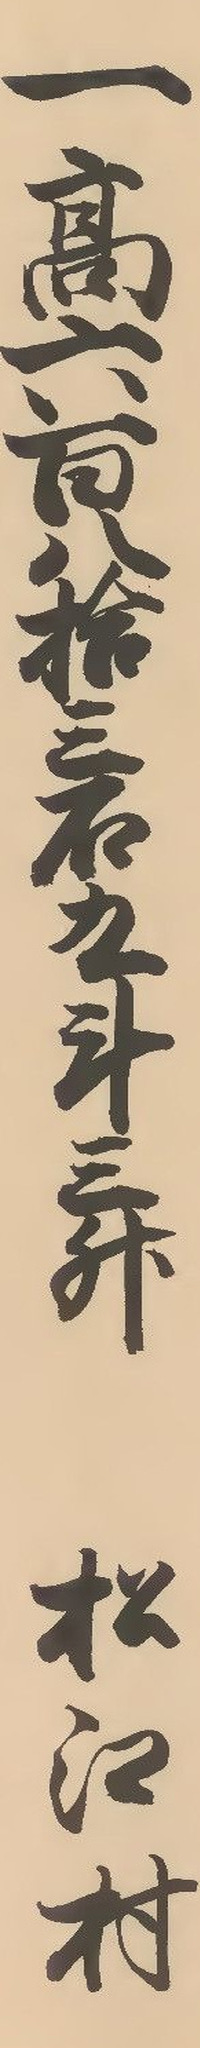一髙六百八拾三石九斗三升松江村
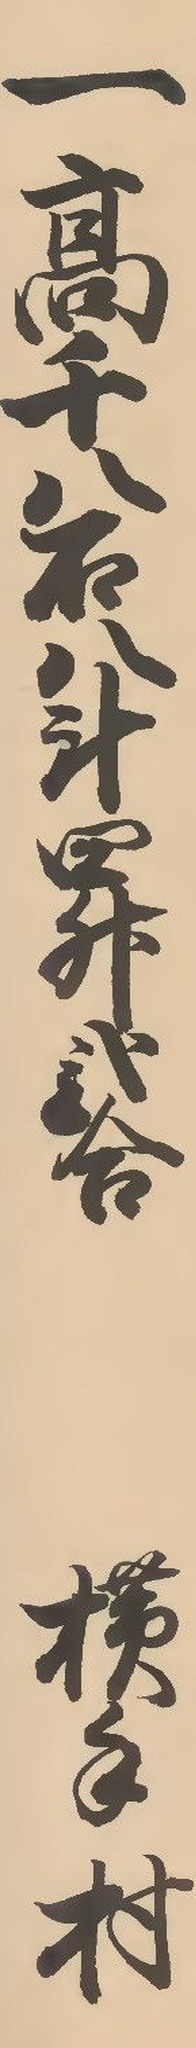一髙千八石八斗四升弐合横手村
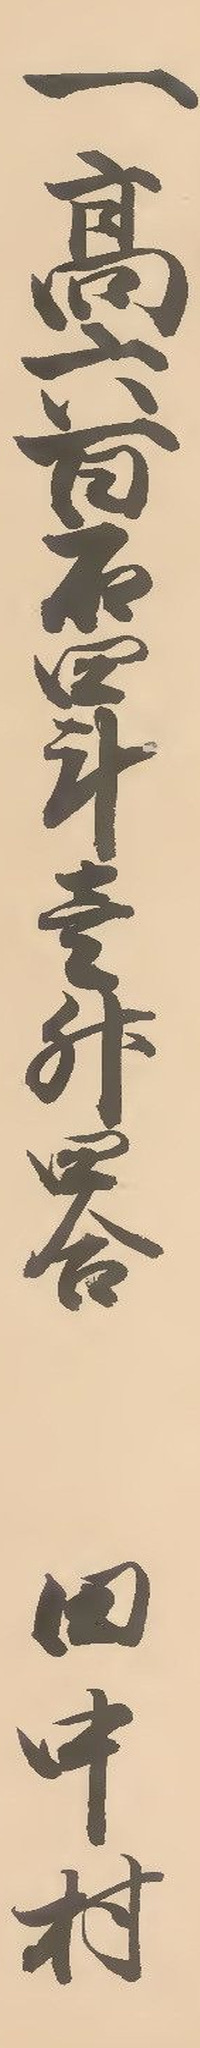一髙六百石四斗壱升四合田中村
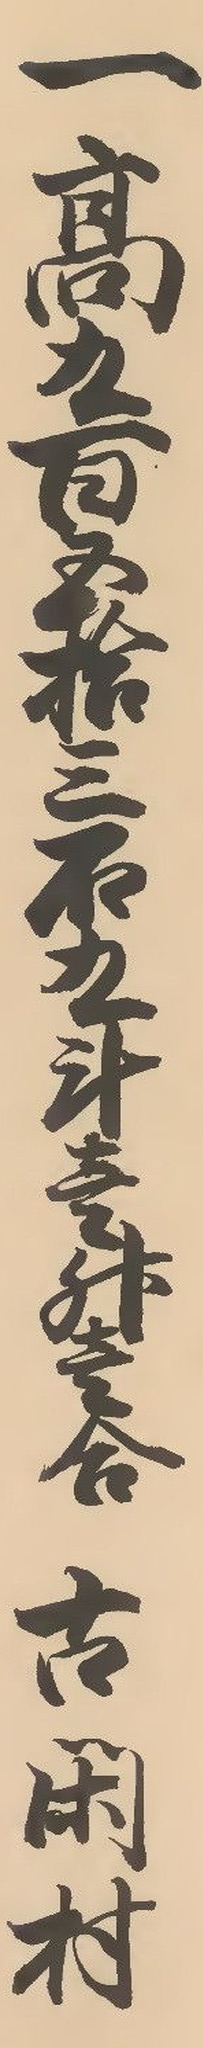一髙九百五拾三石九斗壱升壱合古閑村
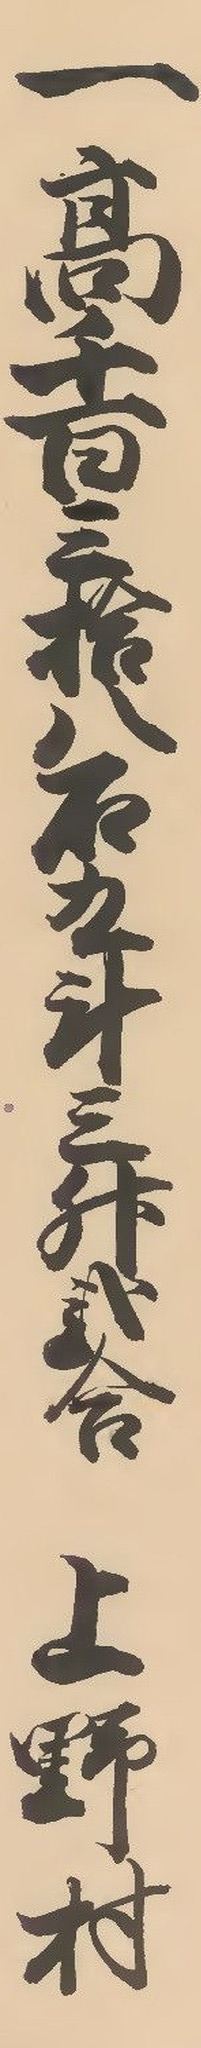一髙千百三拾八石九斗三升弐合上野村
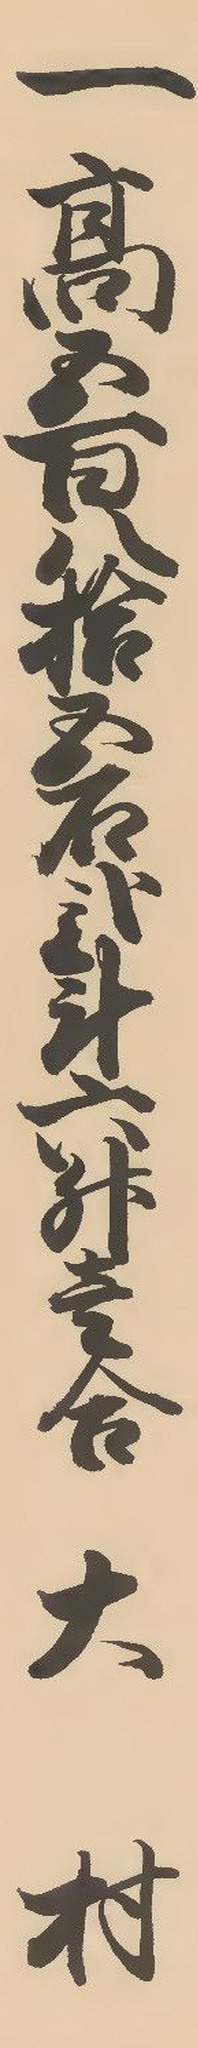一髙五百八拾五石弐斗六升壱合大村

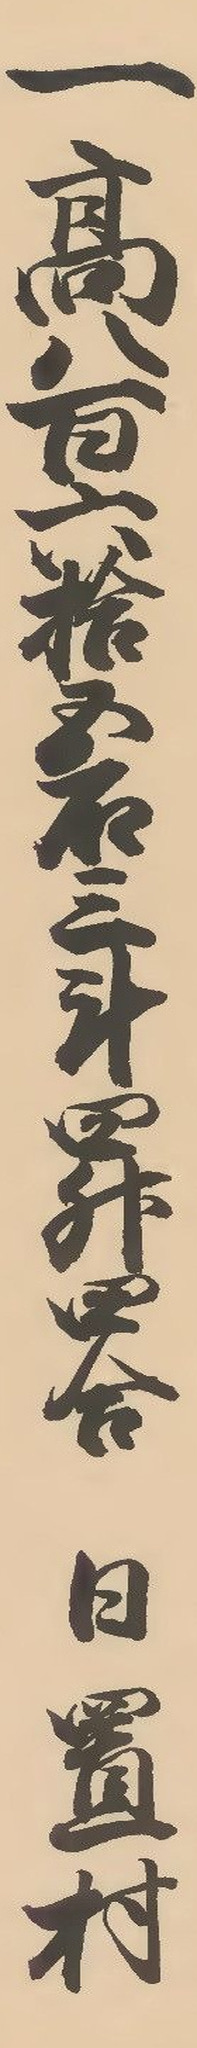一髙八百六拾五石三斗四升四合日置村
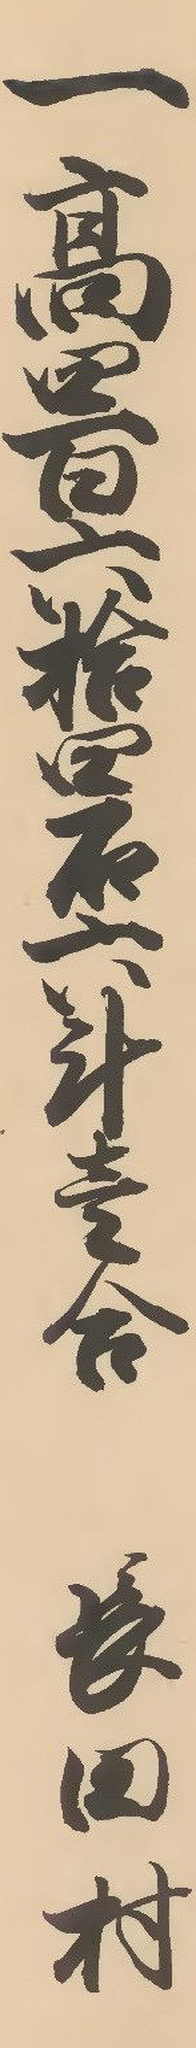一髙四百六拾四石六斗壱合長田村
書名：肥後国郷帳
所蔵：国立公文書館 National Archives of Japan
